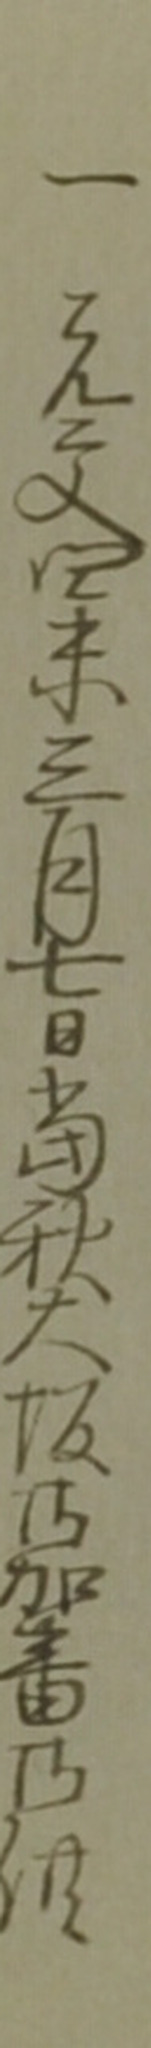一元文四未三月七日当秋大坂御加番御供
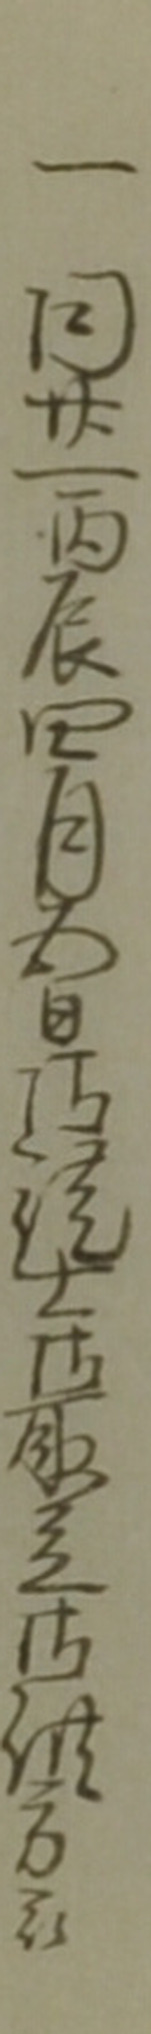一同廿一丙辰四月五日御徒士御取立御供方被

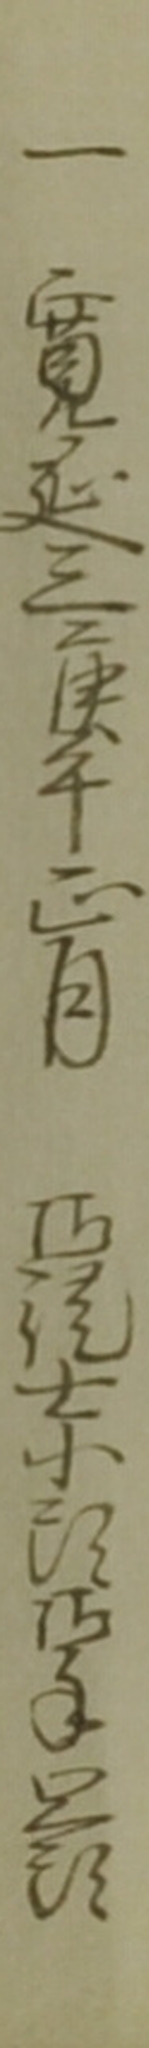一寛延三庚午正月御徒士小頭御手廻頭
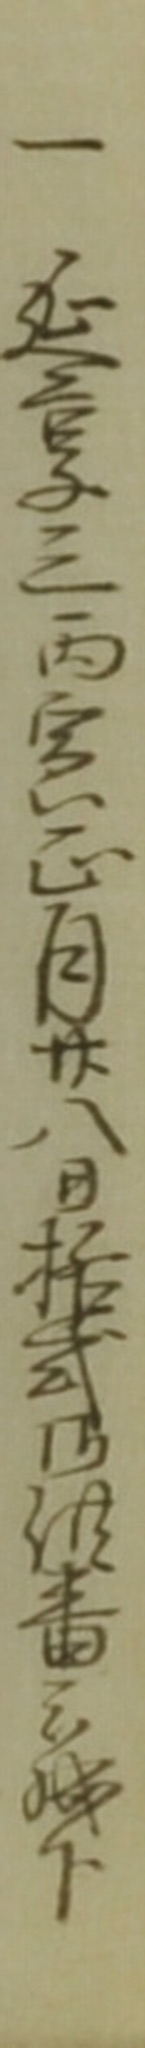一延享三丙寅正月廿八日格式御供番被成下
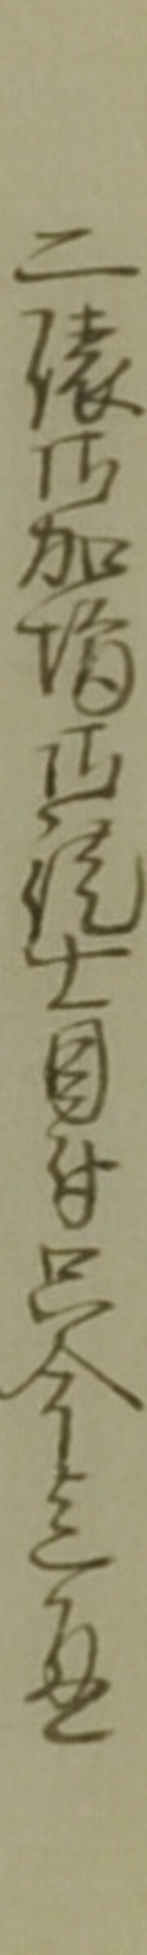二俵御加増御徒士目付只今迄通
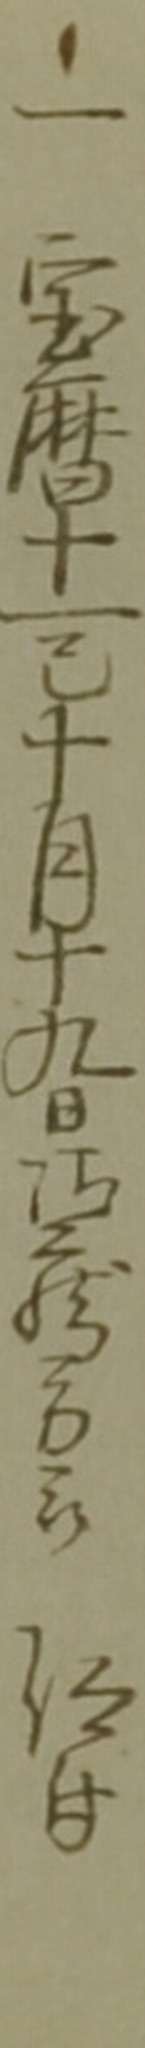一宝暦十一巳十月十九日御蔵方被仰付
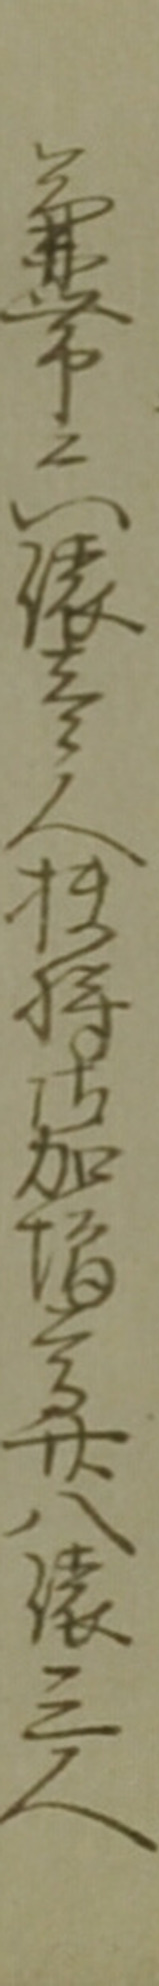兼帯六俵壱人扶持御加増高廿八俵三人
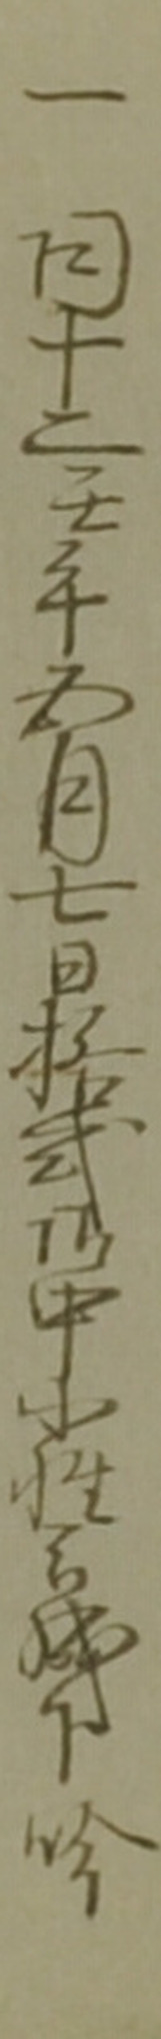一同十二壬午五月七日格式御中小性被成下吟
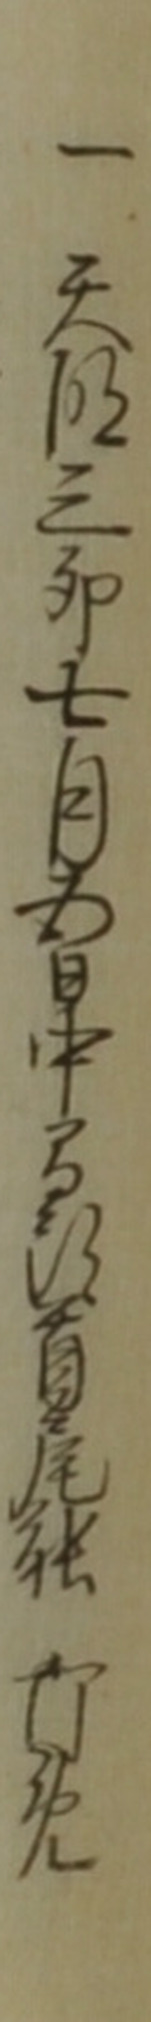一天明三卯七月五日中間頭首尾能御免
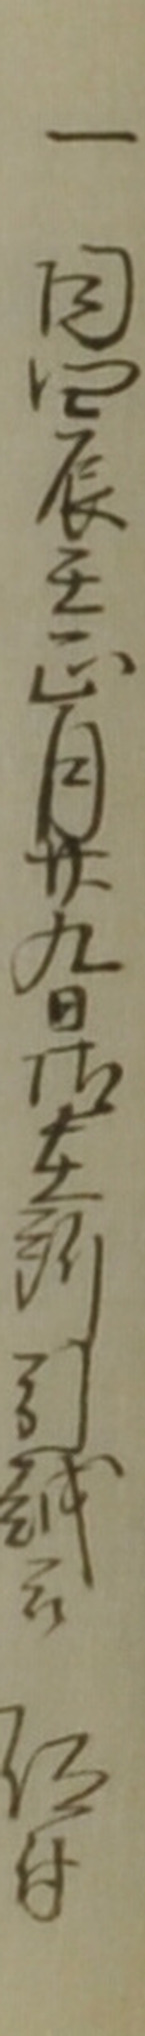一同四辰閏正月廿九日御在所引越被仰付
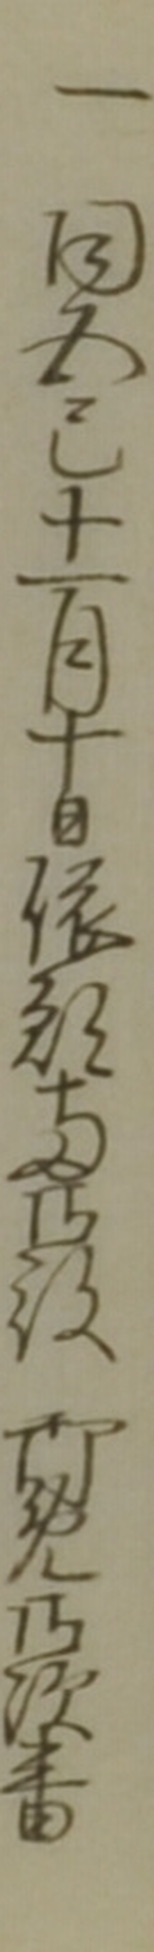一同五巳十一月十日依願両御役御免御次番
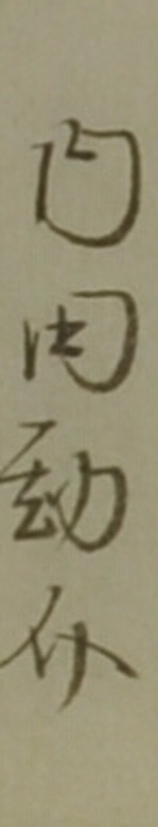内田勘介
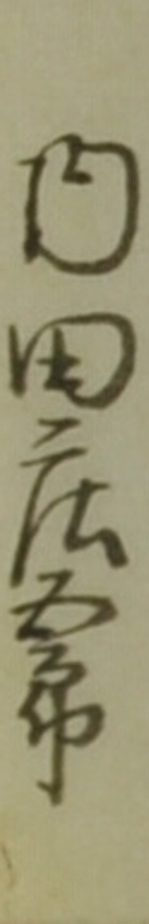内田庄五郎

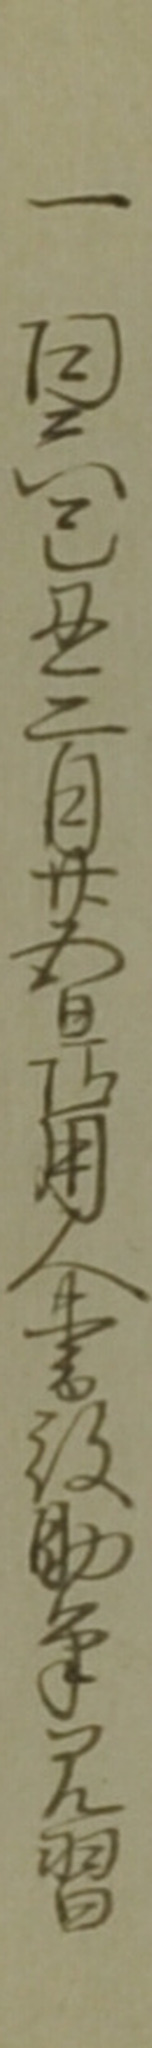一同六己丑二月廿五日御用人書役助筆見習
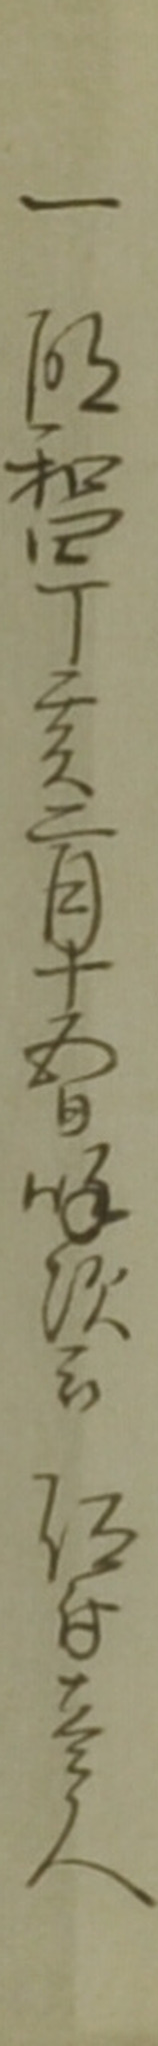一明和四丁亥二月十五日呼次被仰付壱人
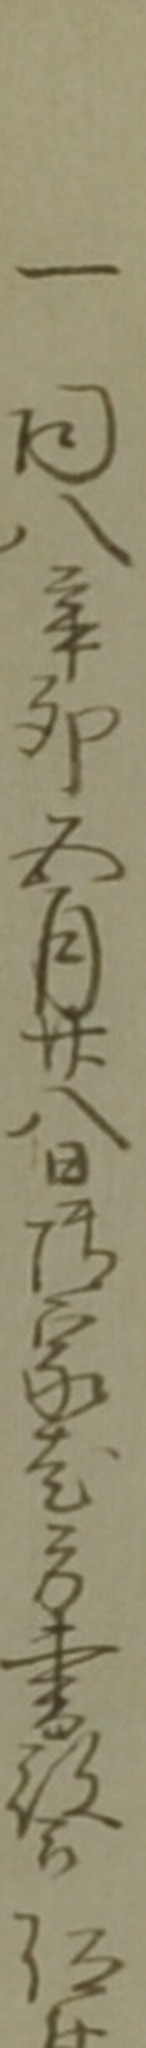一同八辛卯五月廿八日御家老方書役被仰付
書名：無足諸士勤仕録（七）
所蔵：伊那市立高遠町図書館・合同会社AMANE
